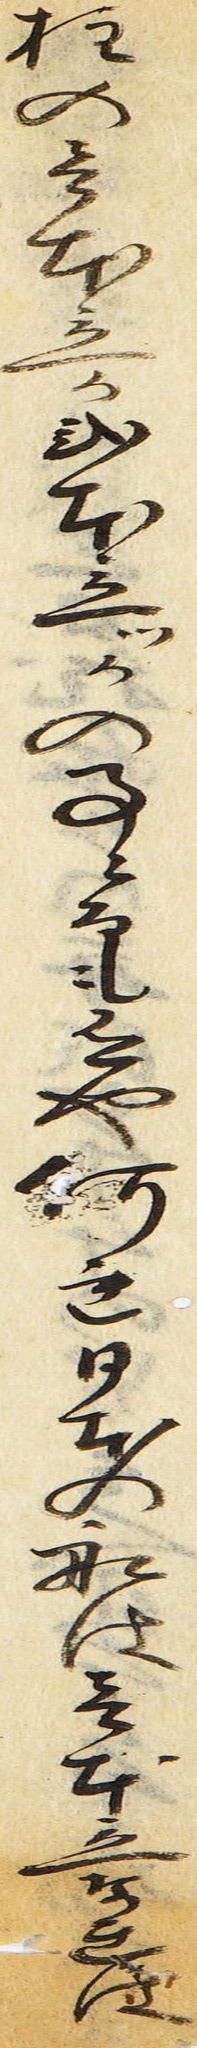柱の壱本立か弐本立ッかの事に而も有や何れ日本の船は壱本立なれは
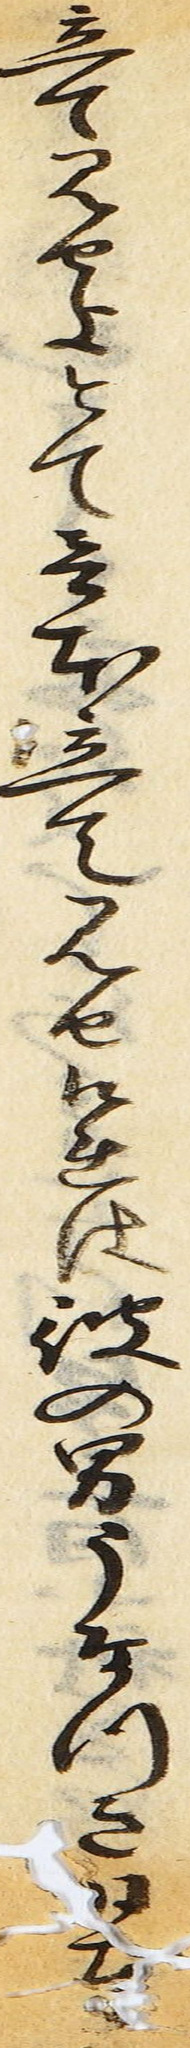立て見せよとて壱本立て見けれは彼の男うなつき日本
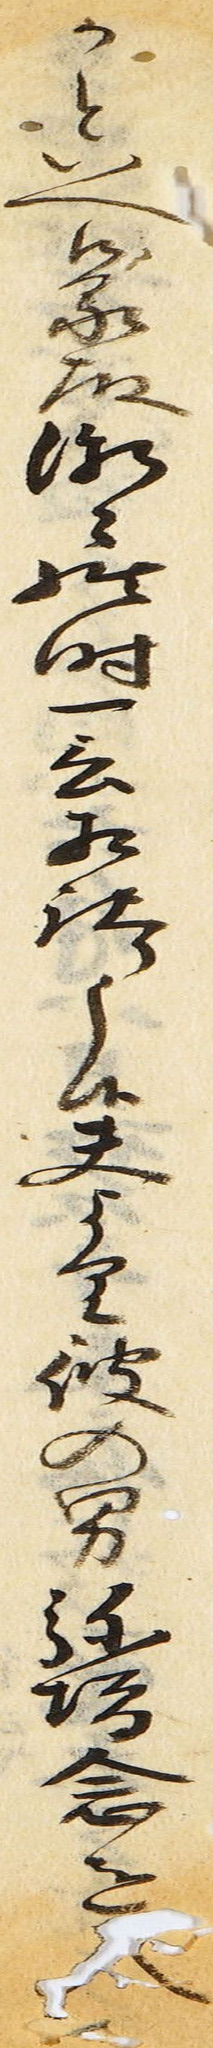かといへける故漸々此時一言相語りし候夫より彼の男弥増念を
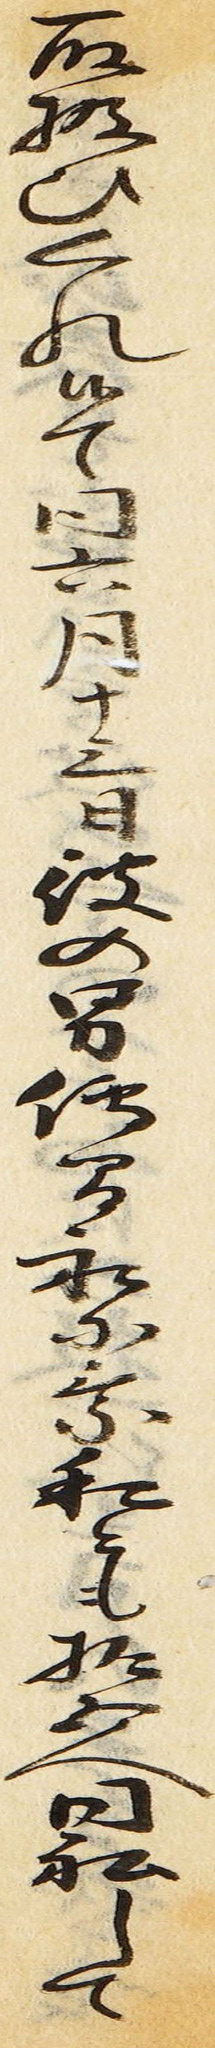取扱ひくれ候て同六月十三日彼の男伝間船に乗私とも拾五人同船して
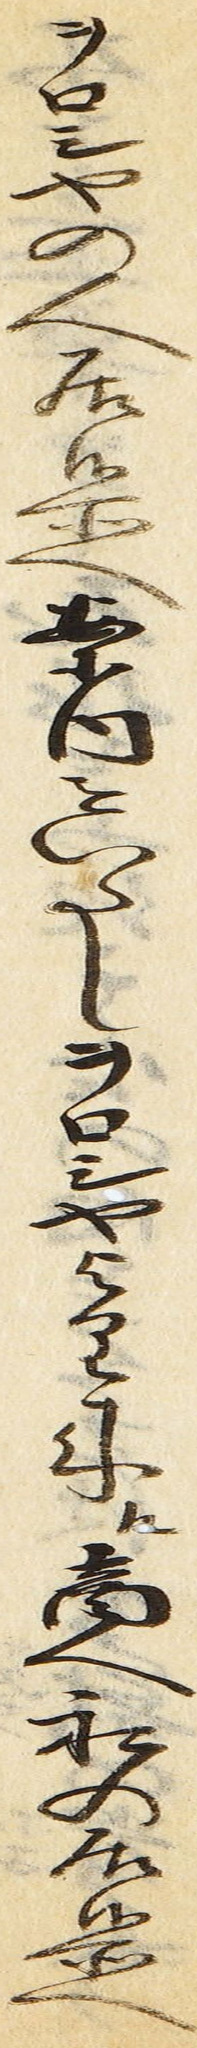ヲロシヤの人居候所へ案内をいたしヲロシヤより来ㇽ商人船の居候所へ
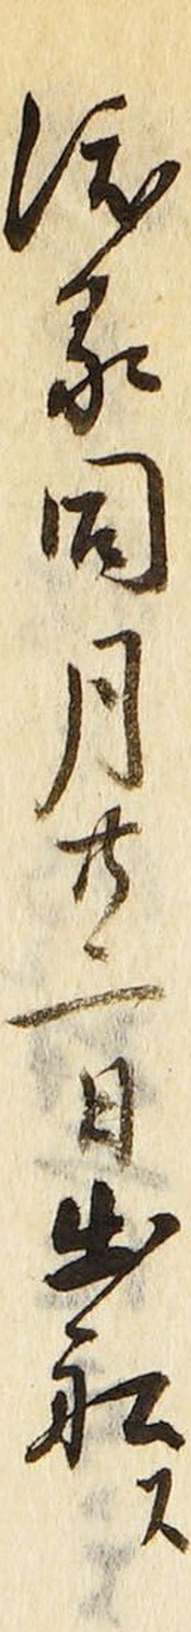流る同月廿二日出船ㇲ
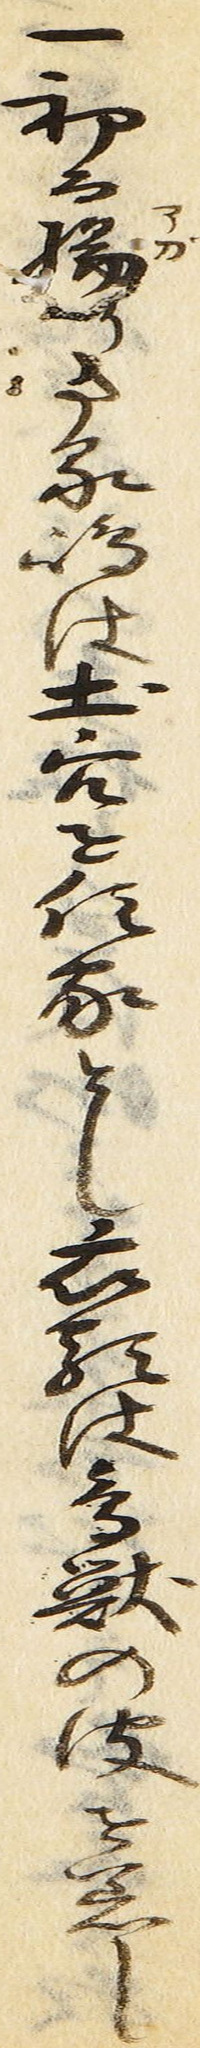一初而揚りたる嶋は土穴を住家とし衣類は鳥獣の皮を着し
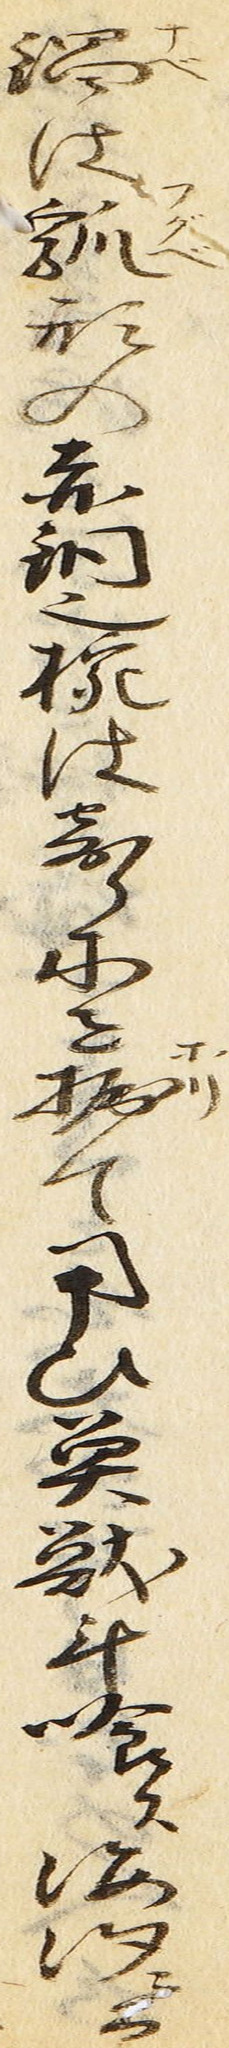鍋は瓢形の赤銅也椀は寄り木を掘て用ひ魚獣計喰ㇲ海汐に而
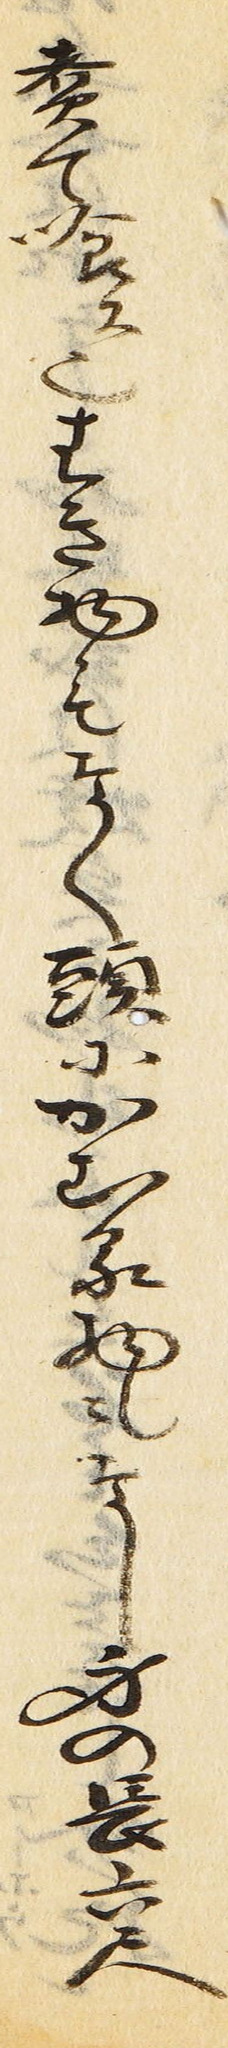煮て喰ㇲ也はき物もなく頭にかむる物もなし身の長六尺
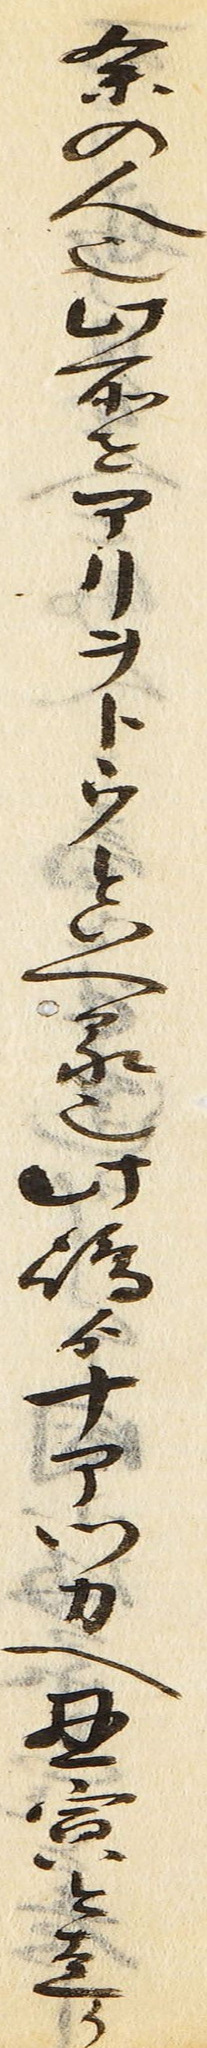余の人也此所をアリヲトウといへる也此嶋ゟナアツカへ丑寅と走り
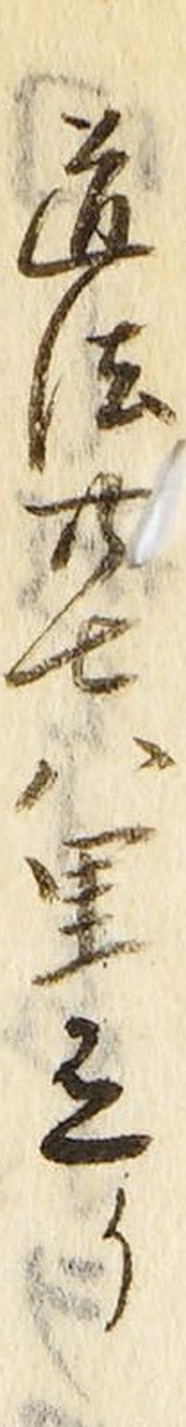道法廿七八里有り
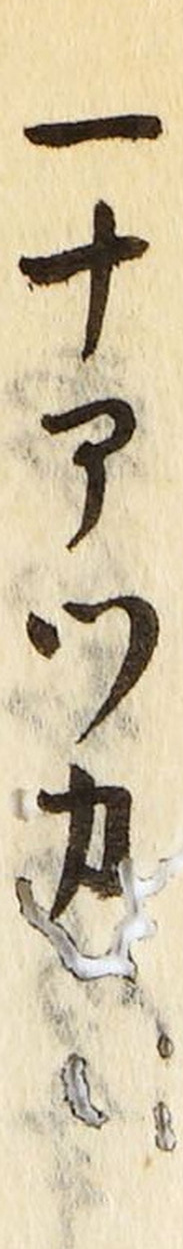一ナアツカ
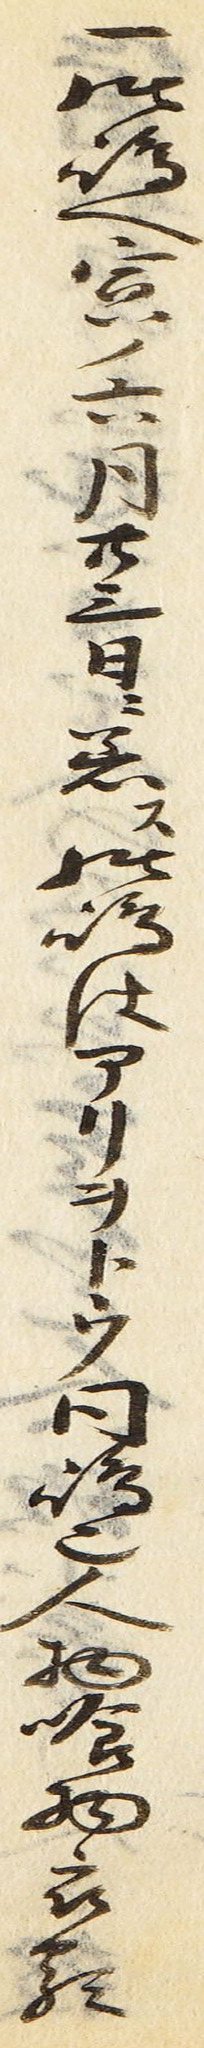一此嶋へ寅ノ六月廿三日に着ㇲ此嶋はアリヲトウ同嶋也人物喰物衣類
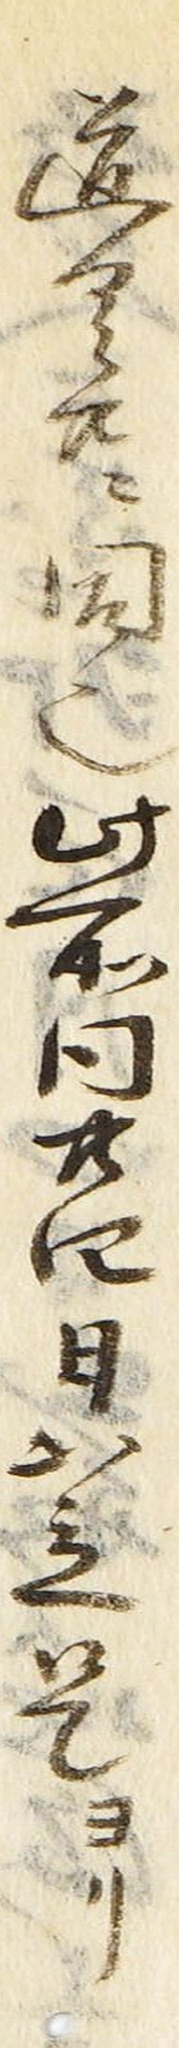道具共に同也此所同廿四日出立是より
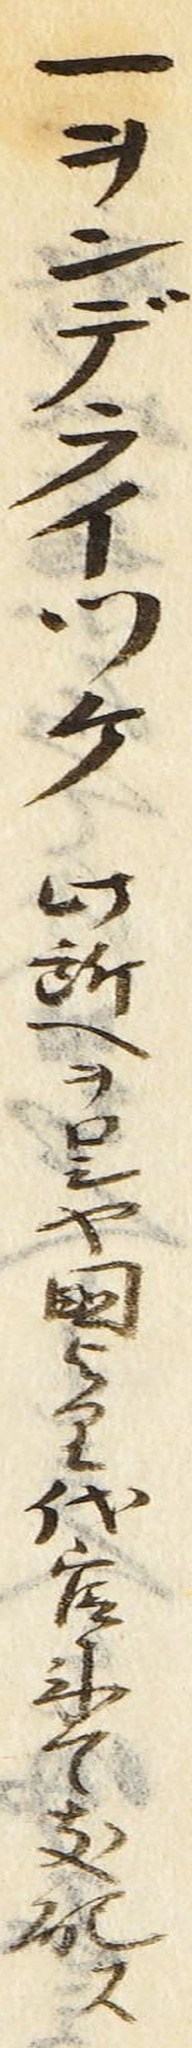一ヲンデライツケ此所へヲロシヤ国より代官来て支配ㇲ
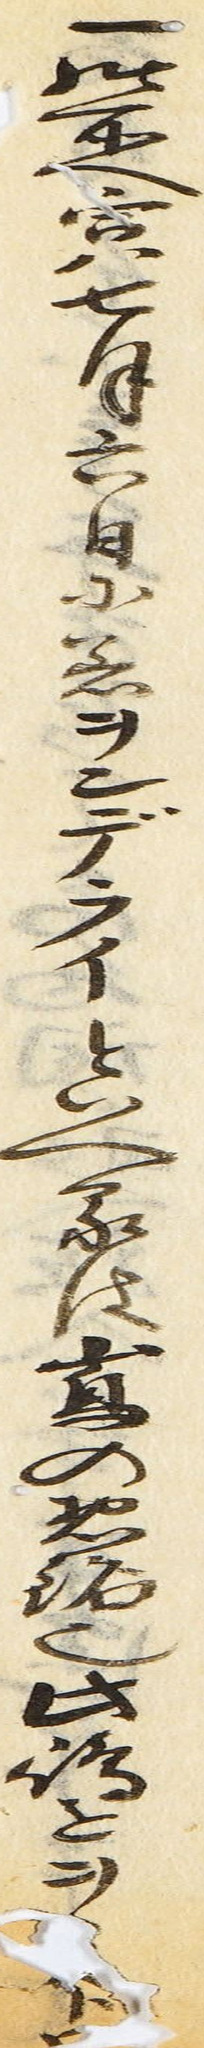一此所へ寅七月六日に着ヲンデライといへるは嶌の惣銘也此嶋をヲト
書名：外国漂流記
